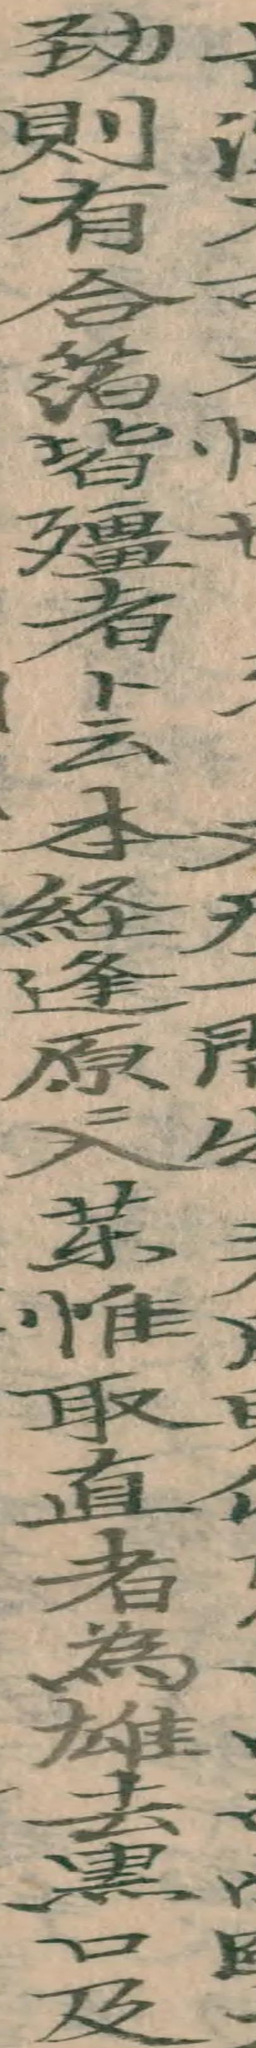𠡍則有合箔皆殭者ト云本経逢原ニ入薬惟取直者為雄去黒口及
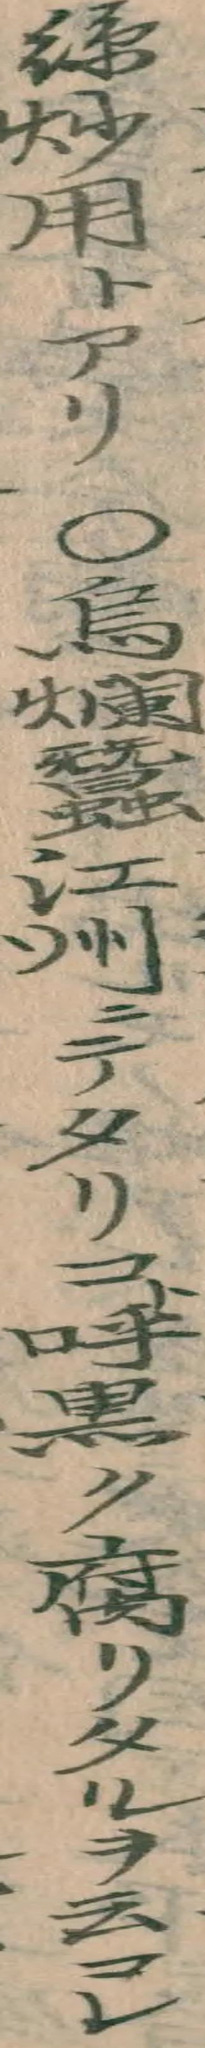絲炒用トアリ○烏爛蠶江州ニテタリコト呼黒ク腐リタルヲ云コレ
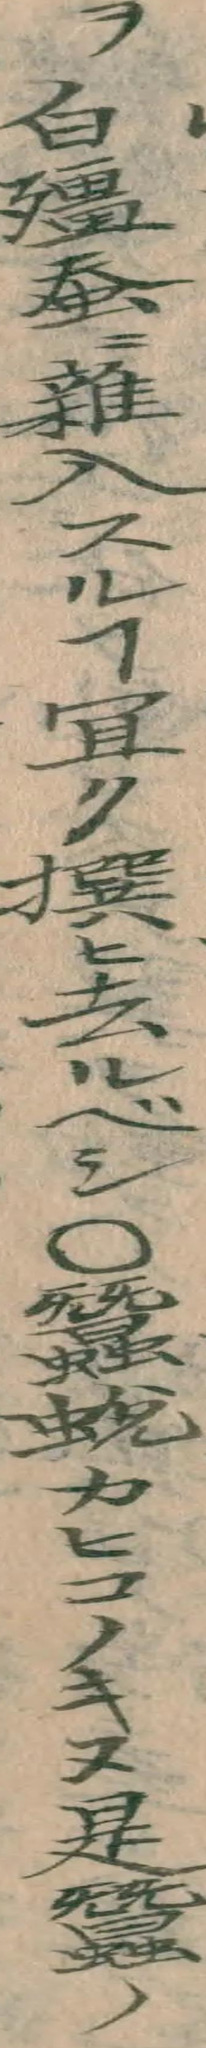ヲ白殭蚕ニ雜入スルコト冝ク撰ヒ去ルベシ○蠶蛻カヒコノキヌ是蠶ノ
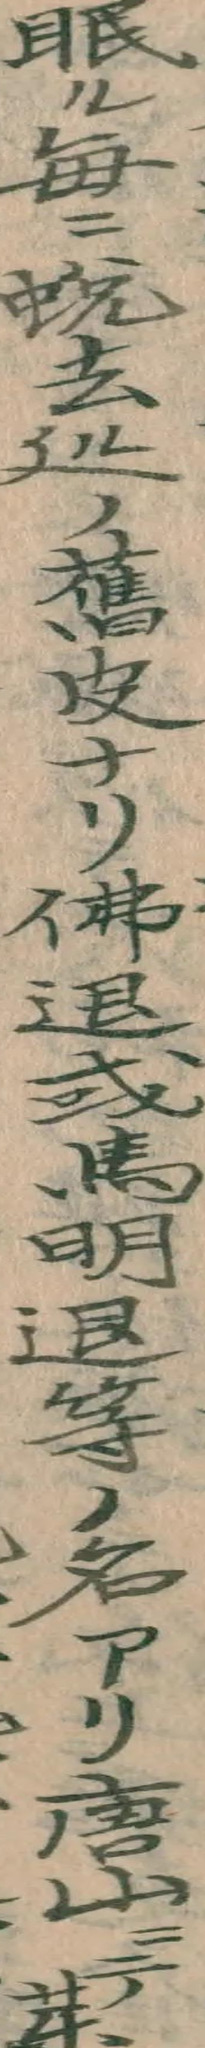眠ル毎ニ蛻去処ノ𦾔皮ナリ佛退或馬明退等ノ名アリ唐山ニテ薬
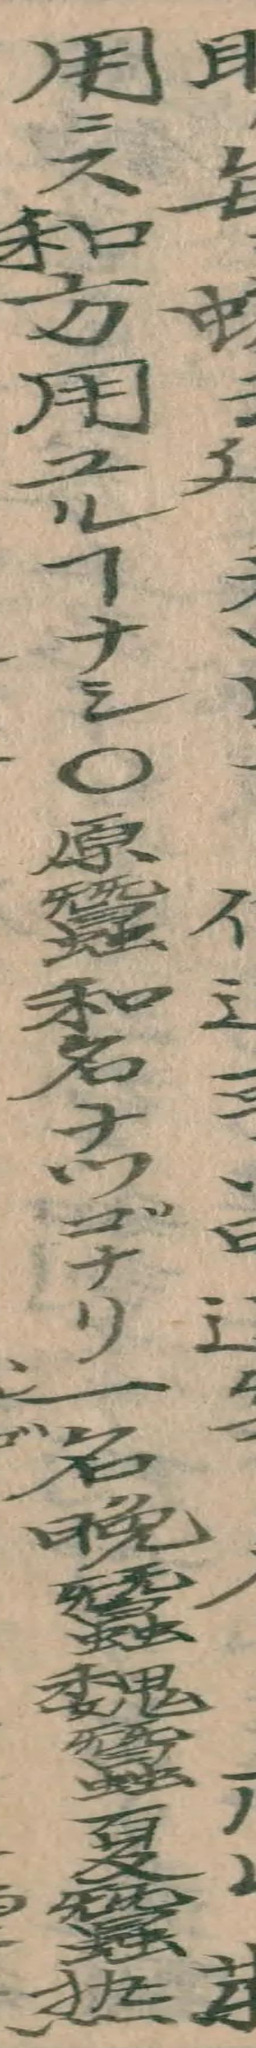用ニス和方用ユルコトナシ○原蠶和名ナツゴナリ一名晩蠶魏蠶夏蠶熱
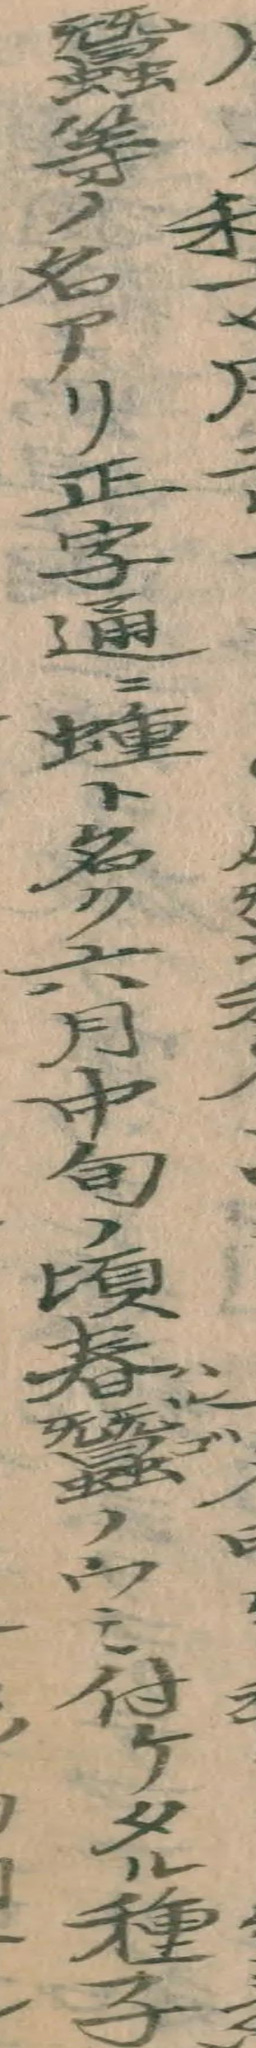蠶等ノ名アリ正字通ニ蝩ト名ク六月中旬ノ頃春蠶ノウミ付ケタル種子
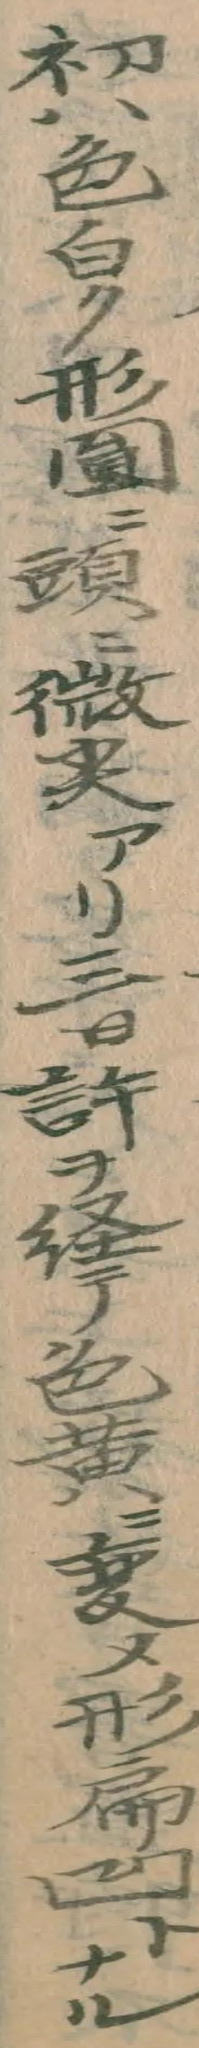初ハ色白ク形圓ニ頭ニ微尖アリ三日許ヲ経テ色黄ニ変シテ形扁凹トナル
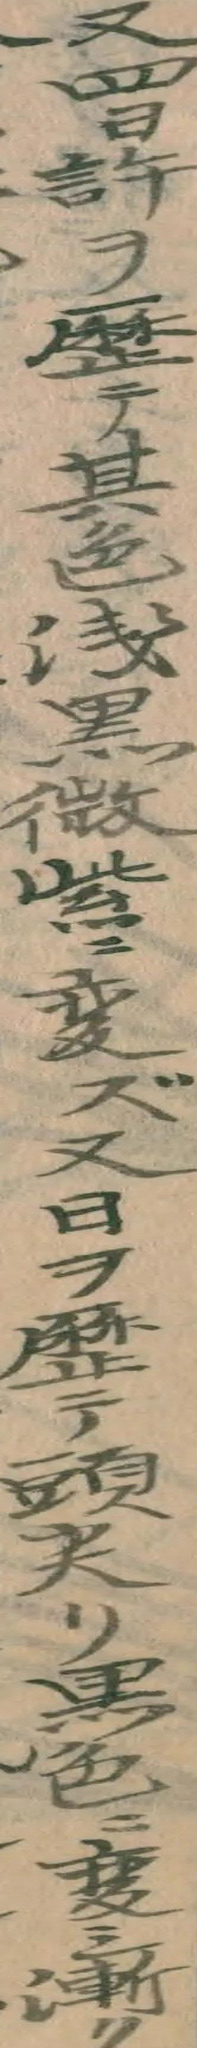又四日許ヲ歷テ其色浅黒微紫ニ変ズ又日ヲ歷テ頭尖リ黒色ニ変シ漸ク
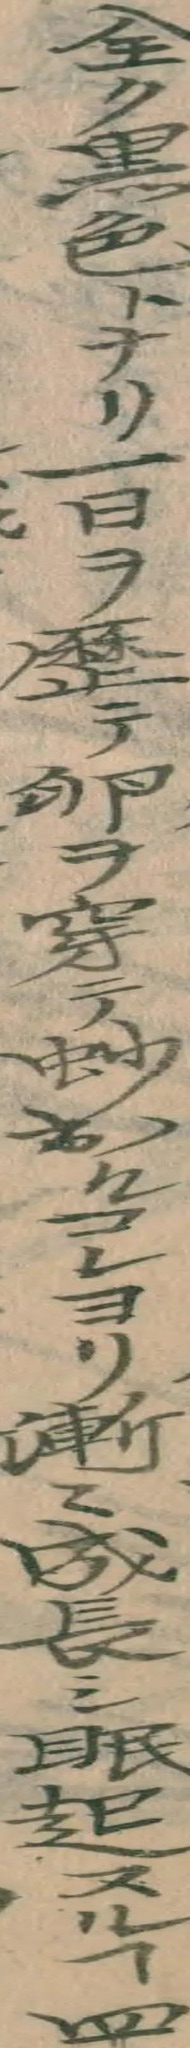全ク黒色トナリ一日ヲ歷テ卵ヲ穿テ䖢出ルコレヨリ漸〻成長シ眠起スルコト四
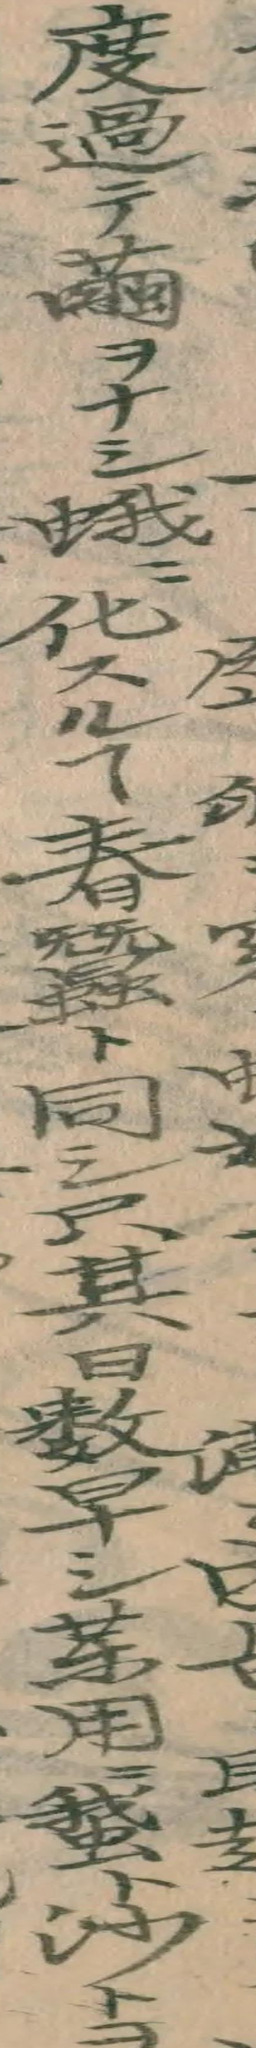度過テ繭ヲナシ蛾ニ化スルコト春蠶ト同シ只其日数早シ薬用ニ䖸ト沙トヲ
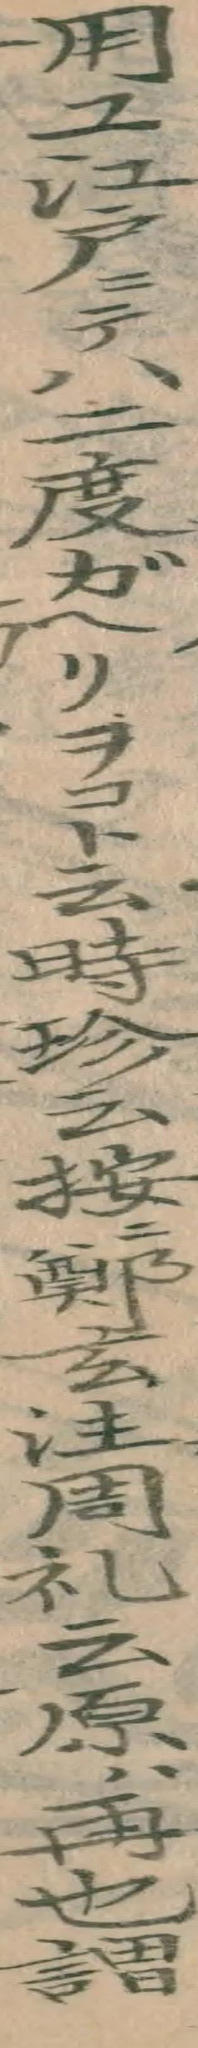用ユ江戸ニテハ二度ガヘリヲコト云時珍云按ニ鄭玄注周礼云原ハ再也謂
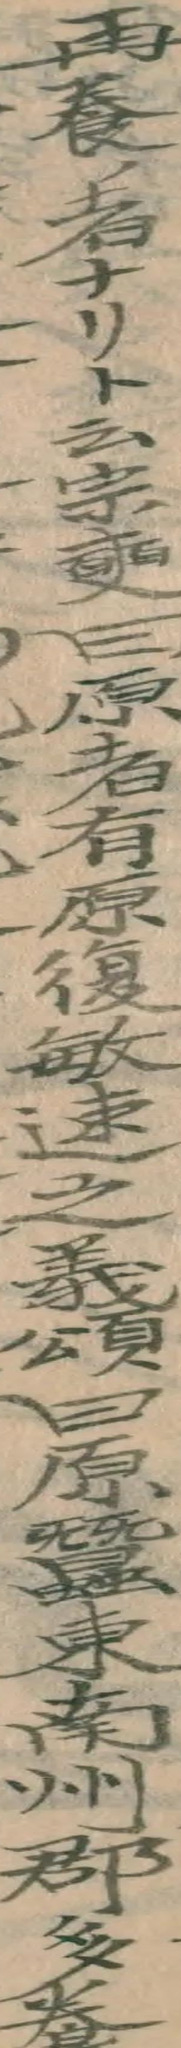再養ノ者ナリト云宗奭曰原者有原復敏速之義頌曰原蠶東南州郡多養
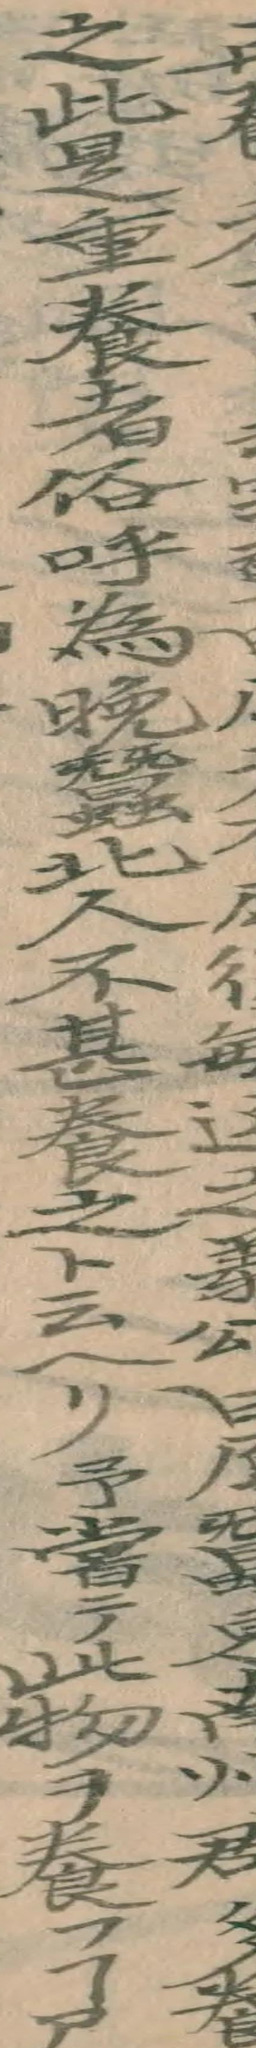之此是重養者俗呼為晩蠶北人不甚養之ト云ヘリ予甞テ此物ヲ養フコトア
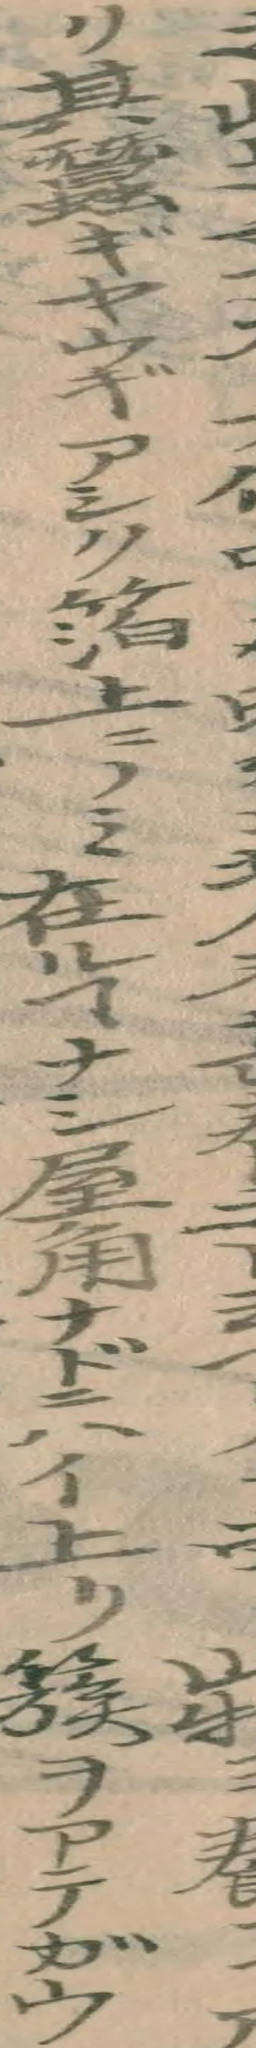リ其蠶ギヤウギアシク箔上ニノミ在ルコトナシ屋角ナドニハイ上リ蔟ヲアテガウ
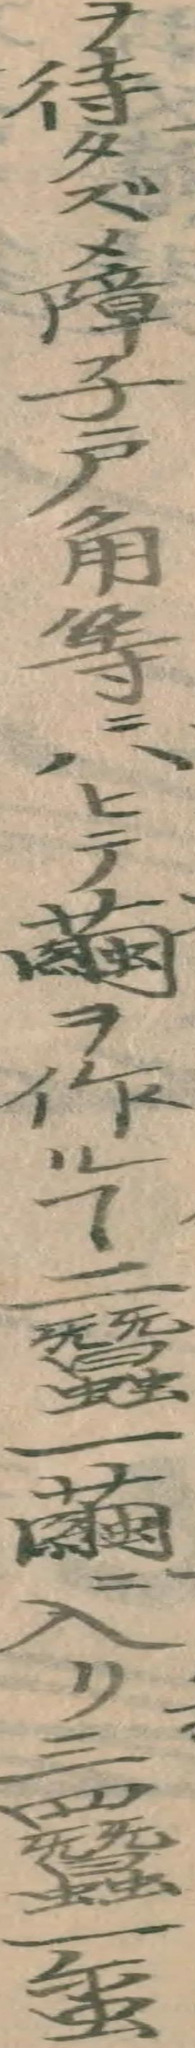ヲ待タズシテ障子戸角等ニハヒテ繭ヲ作ルコト二蠶一繭ニ入リ三四蠶一𫊱
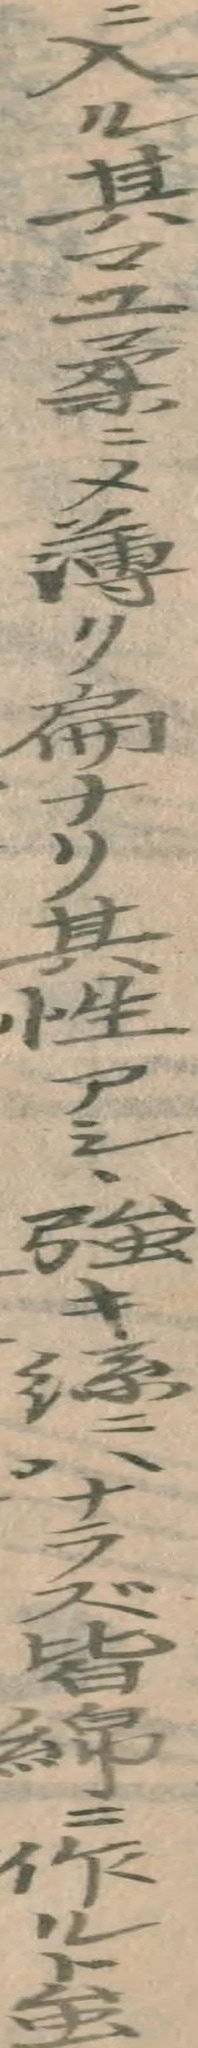ニ入ル其マユ柔ニシテ薄ク扁ナリ其性アシヽ強キ絲ニハナラズ皆綿ニ作ルト虽
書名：千蟲譜 3巻. [1]
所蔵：国立国会図書館 National Diet Library, JAPAN
